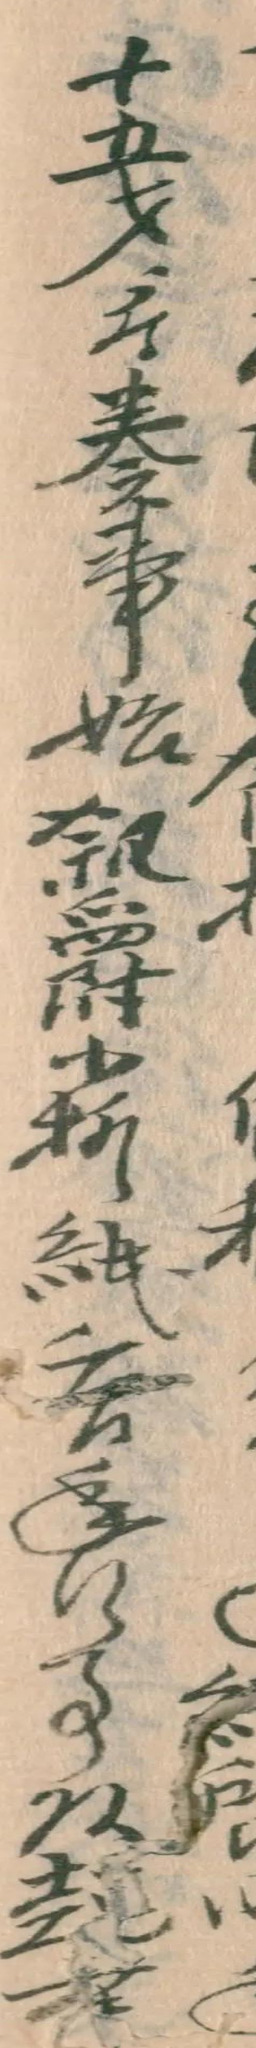十五才ニ付奏事始叙爵小折紙今日年行事頭起幸
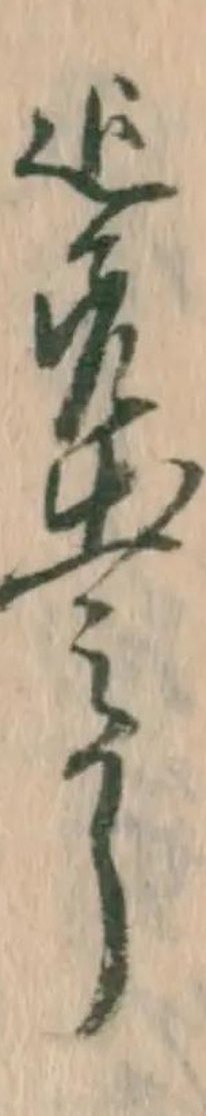迄差出之了
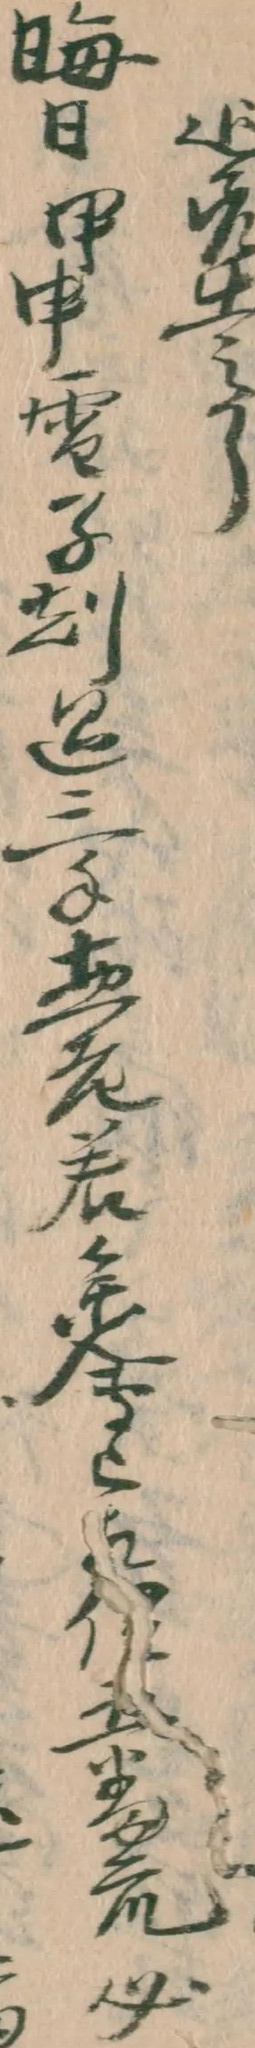晦日甲申雪子刻過三手惣老若参會被相催五番衆必
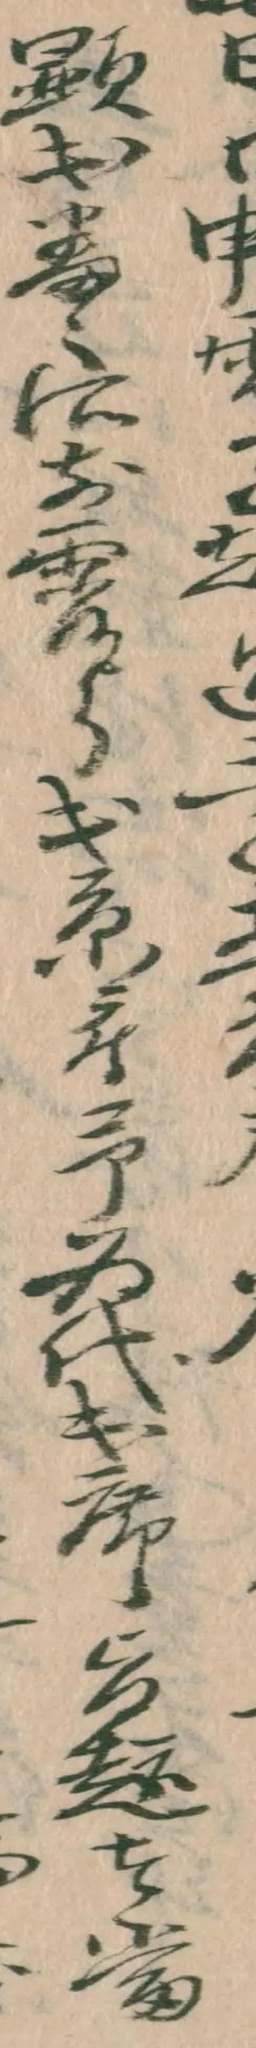顕出番之所前より出京ニ付予為代出席旨趣は當
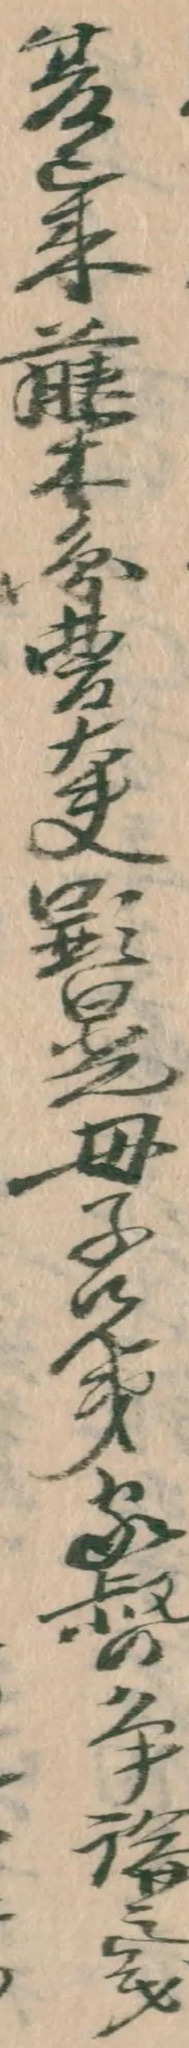夏已来藤木図曹大夫顕晃母子兄弟家督争論之義
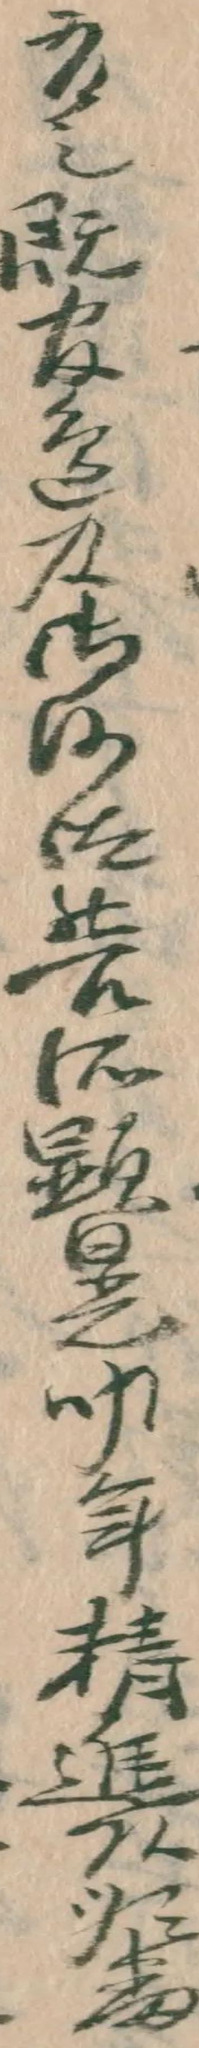有之既官邊及御沙汰仕候所顕晃明年精進頭順番
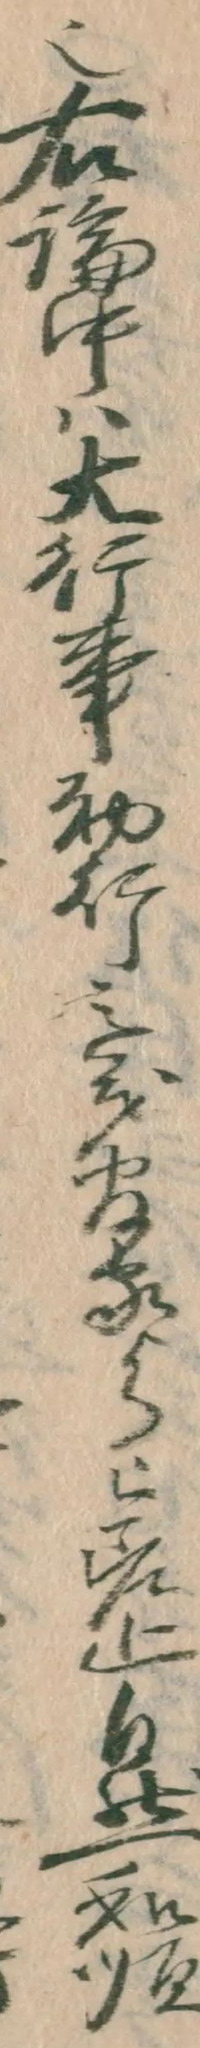也右論中ハ大行事勤行之義官家より被差止自然和順
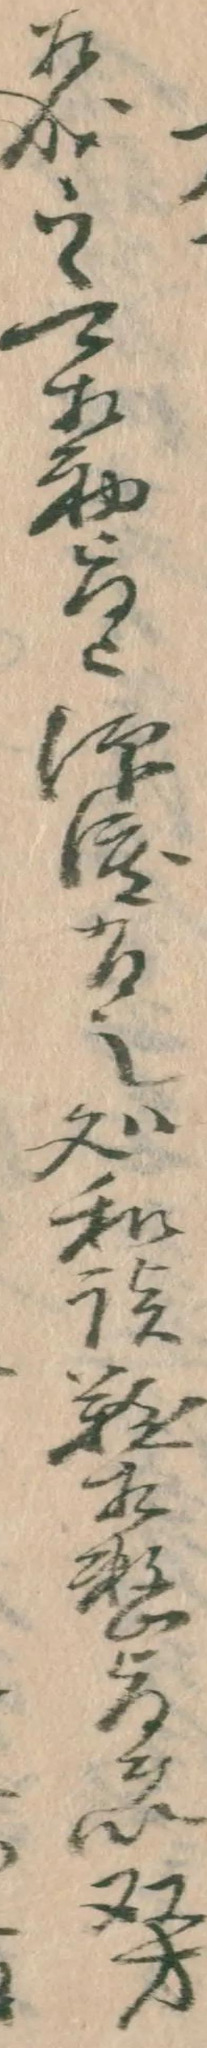相成候ハヽ可相勤旨被仰渡有之処和談難相整旨ヲ以双方
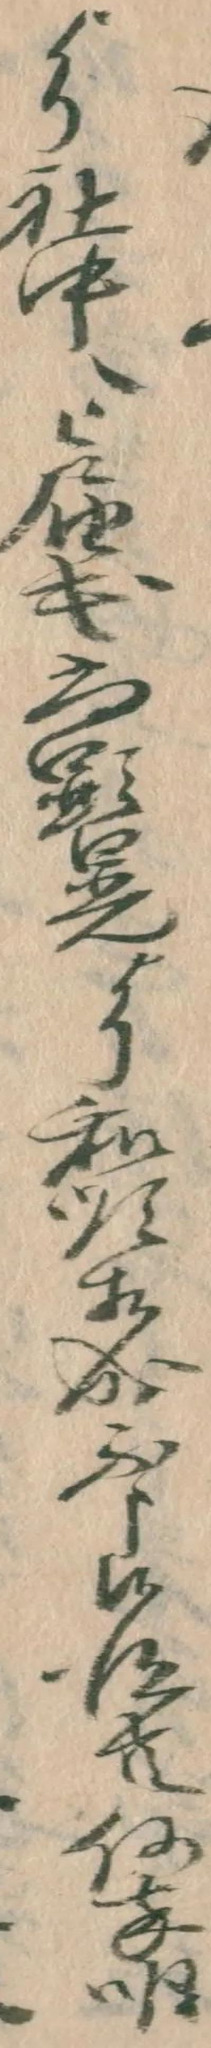より社中へ被届出尚顕晃より和順相成不申候得共何卒明
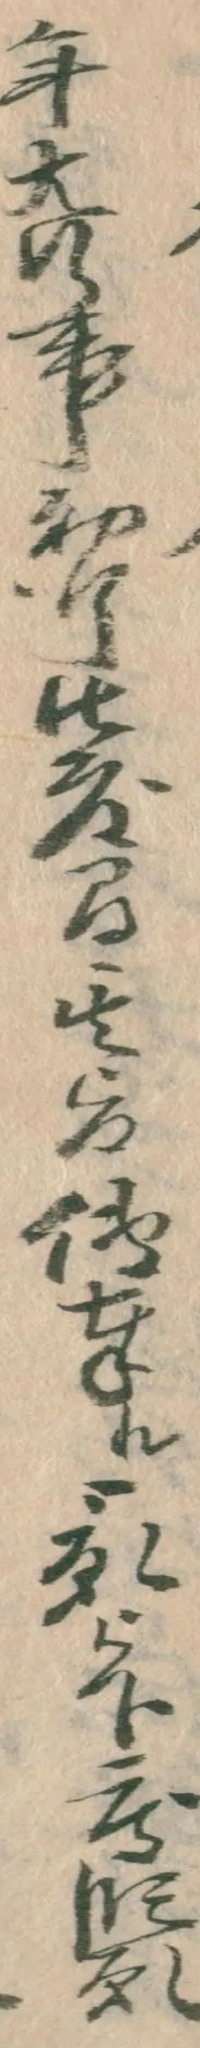年大行事勤此度間其旨傳奉え御願被下度段願
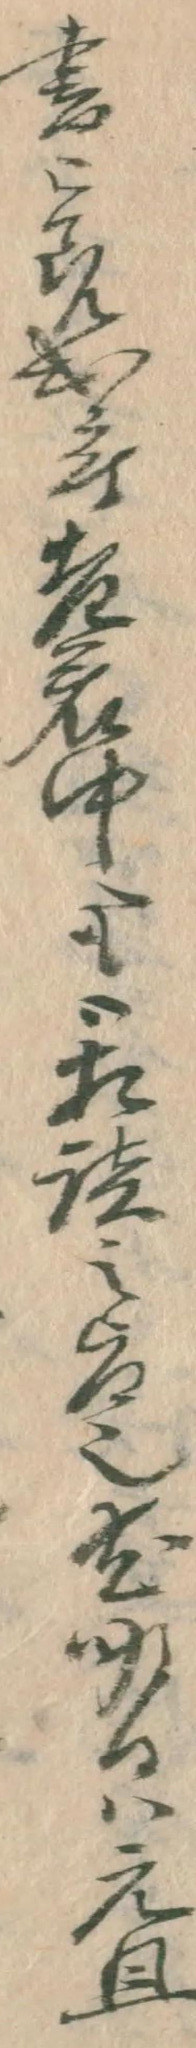書被差出ニ付老若中へも相談之旨也尤明日ハ元旦
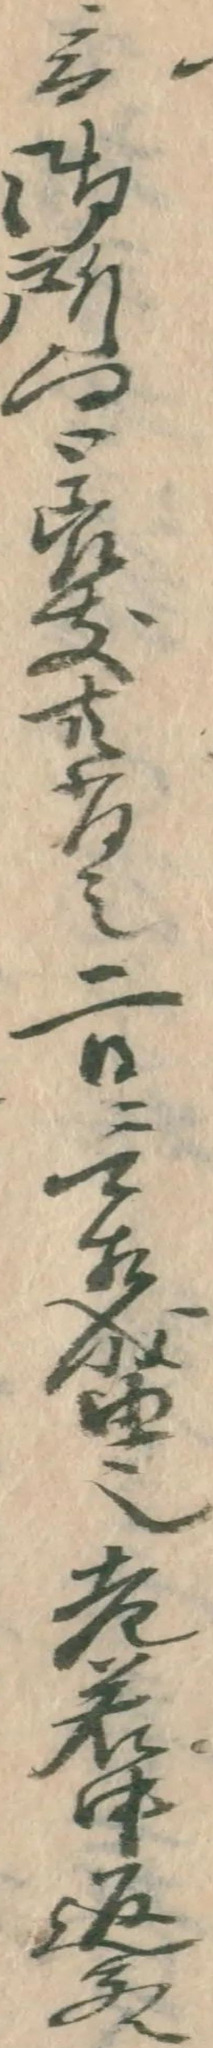二而御所向御差支共有之二日に可相成由也老若中返答
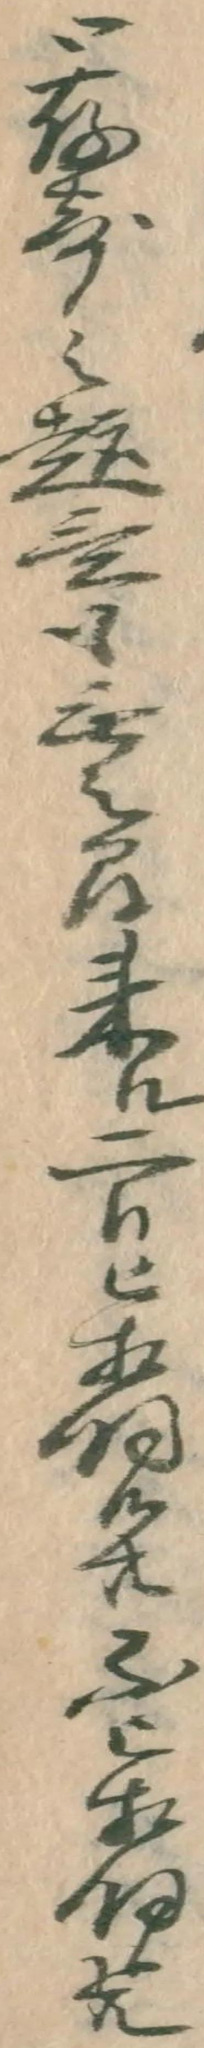御存寄之趣意も無之間来ル二日被相伺候共不被相伺共

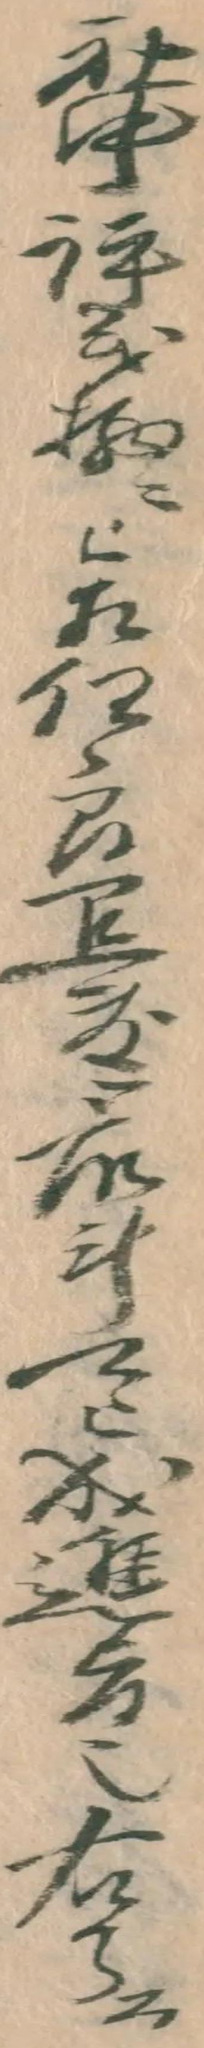社中評義扨ニ被相任候間宜敷ニ取斗可被成進旨也右了而
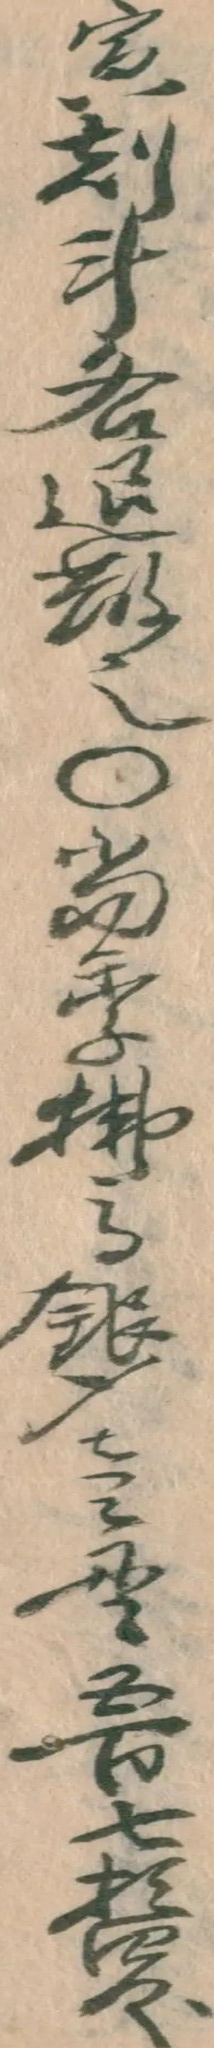寅刻斗各退散也○當季払高銀〆壱貫五百七拾四匁
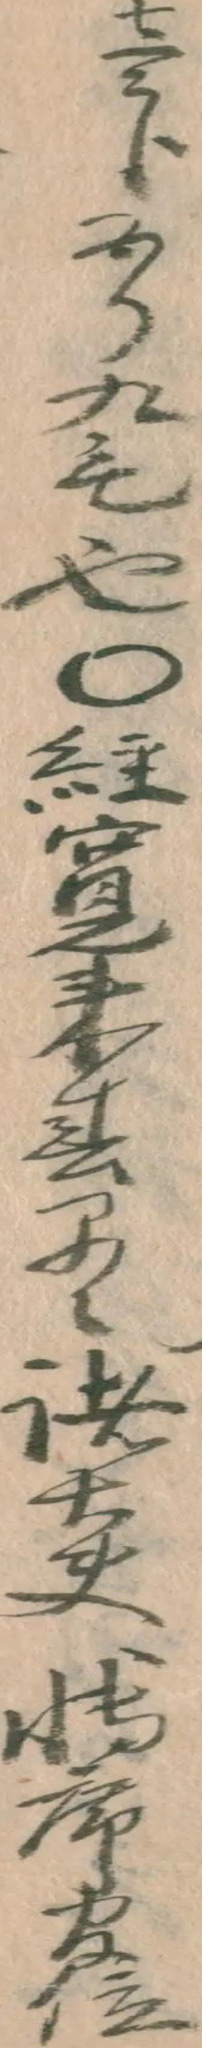壱分五り九毛也○経寛来春早々諸大夫へ転席官位
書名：賀茂社記録. 第67冊
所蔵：国立国会図書館 National Diet Library, JAPAN
